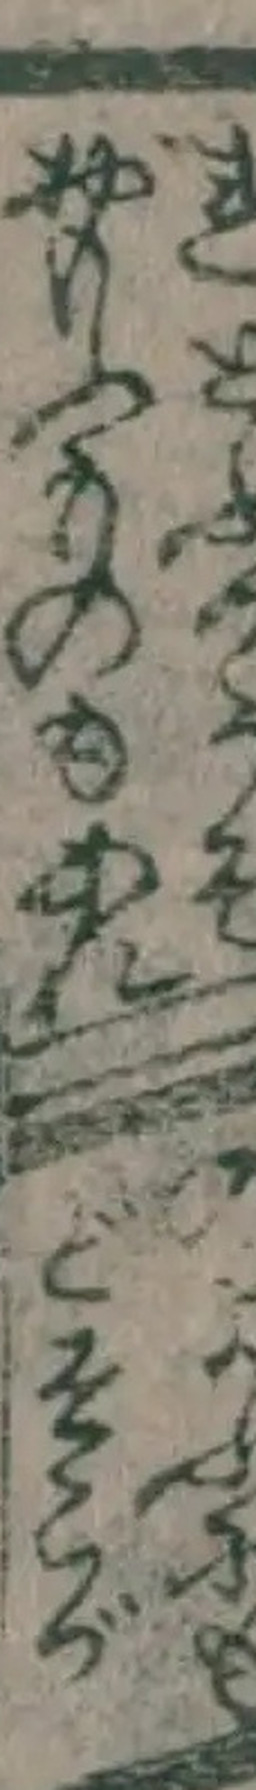おもふものもあれどそこが
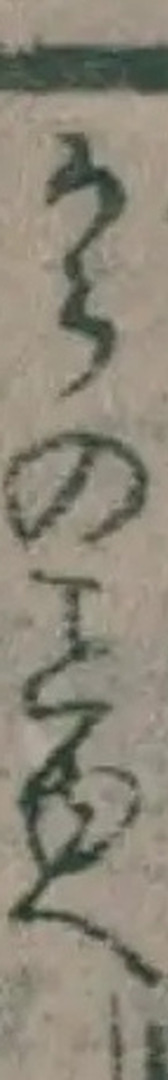からのことゆへ
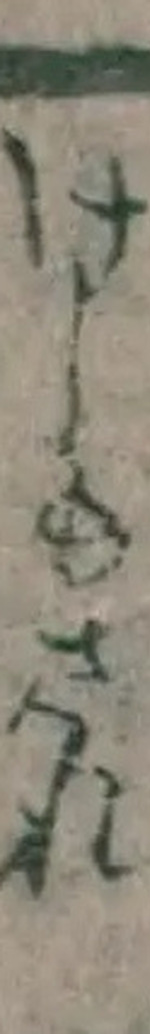けしもされ
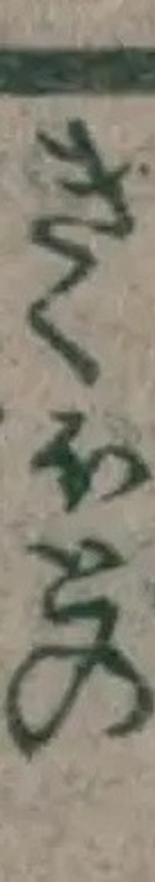きくほとの
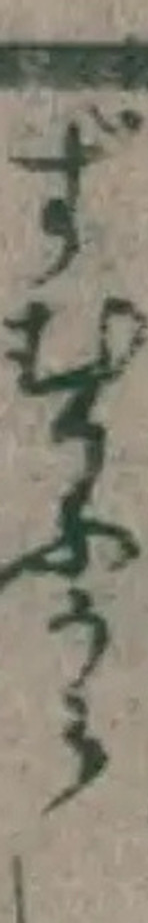ずむかふから
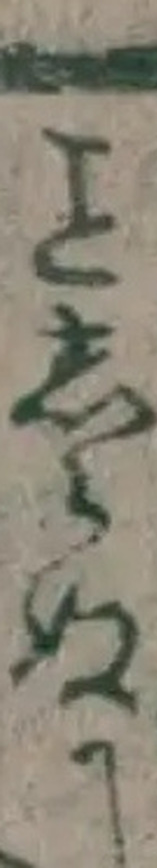ことしらぬ
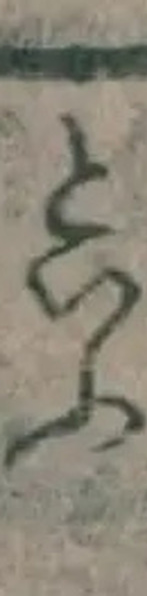といふ
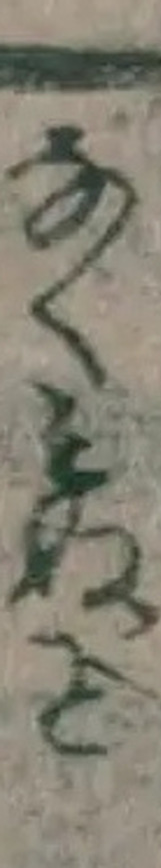なくみぬと
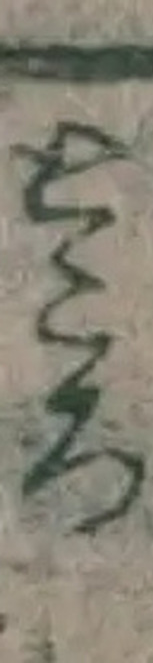ところ
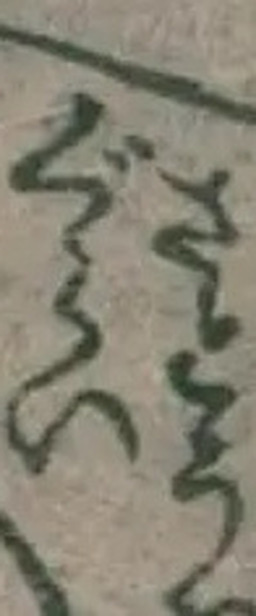ぐらい
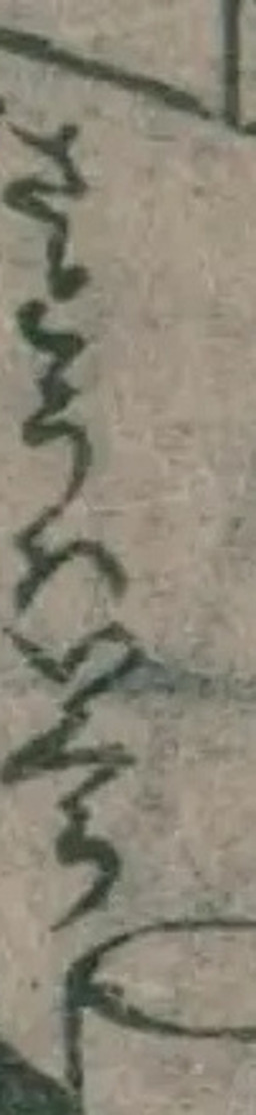さとうはいくら
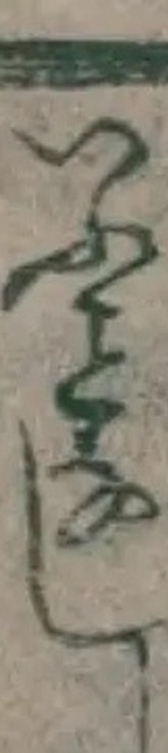いふことなし
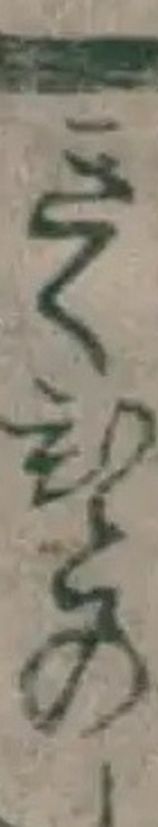きくひとの
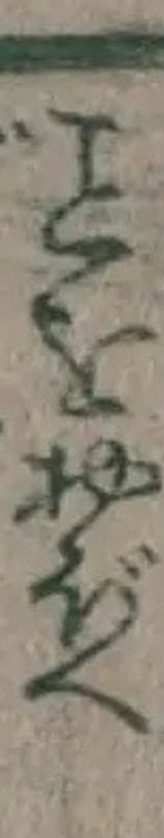ことをおぼへ
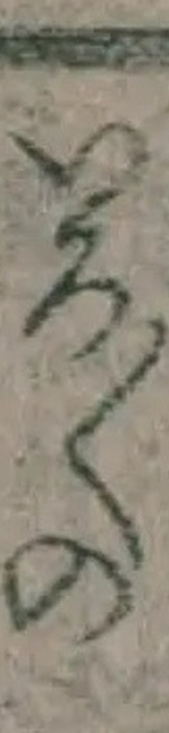いろ〳〵の
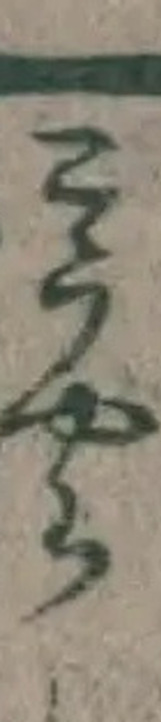こうやら
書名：縦筒放唐の噺 3巻
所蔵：国立国会図書館 National Diet Library, JAPAN
